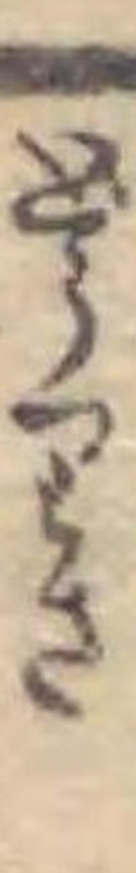どうりさ
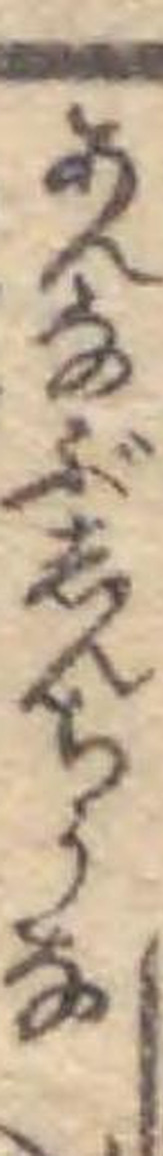あんなぶしんちうな
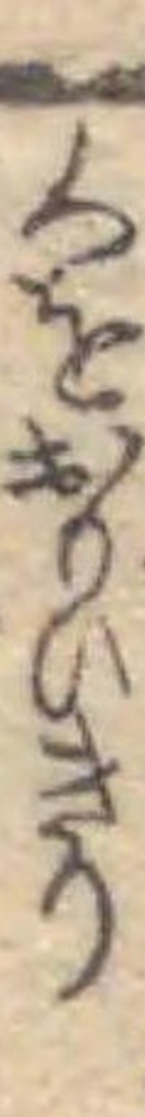人をおもひきり
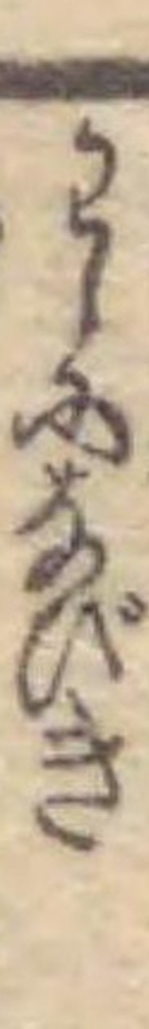わしになびき
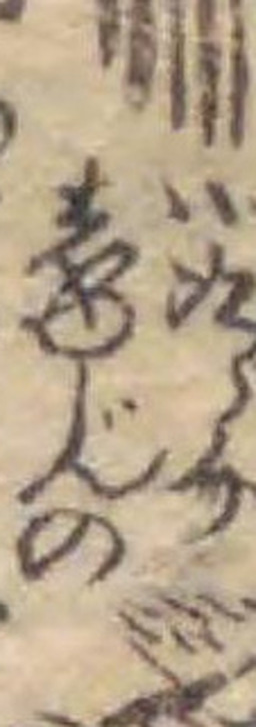しゆじんの
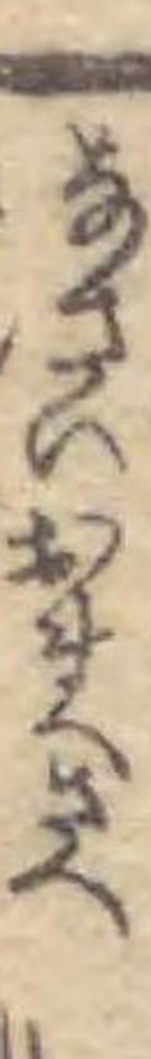なさいおまへさへ
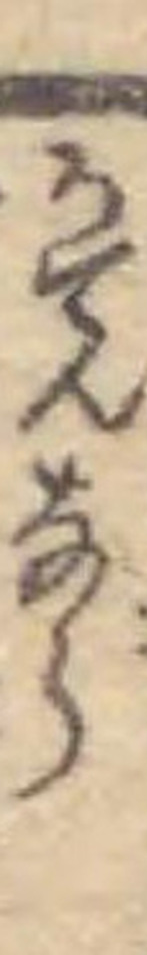かてんなら
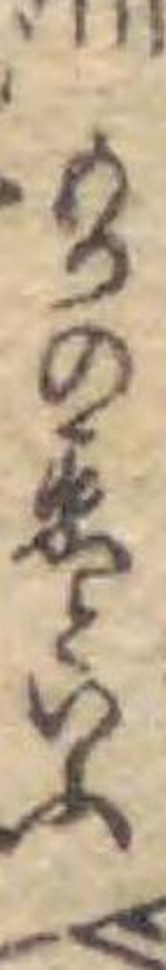もりの丞といふ
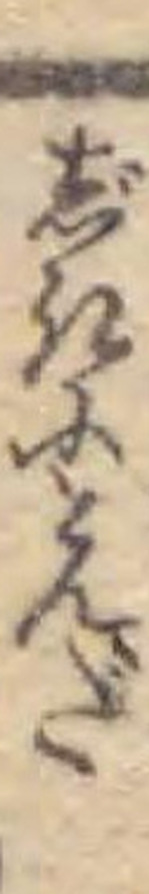じきにとんだ
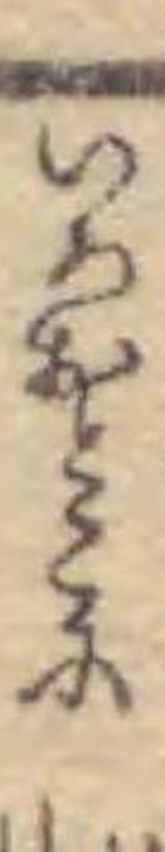いろおとおに
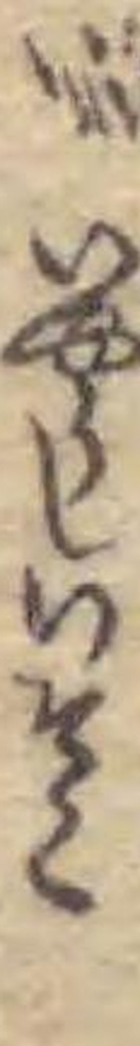いやらしいそこ
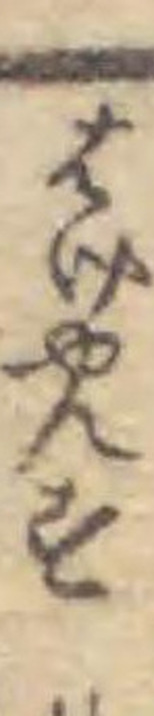はけやんす
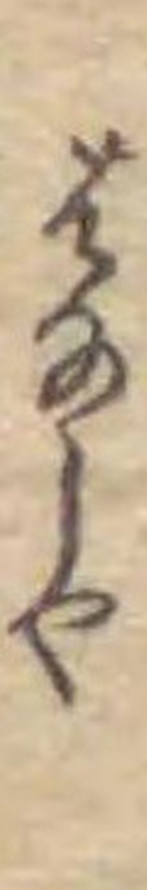はなしや
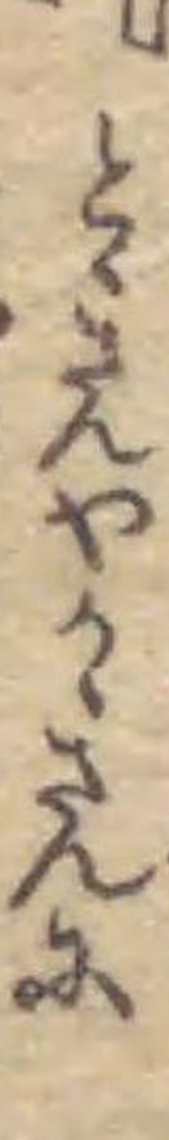とゝさんやかゝさんに
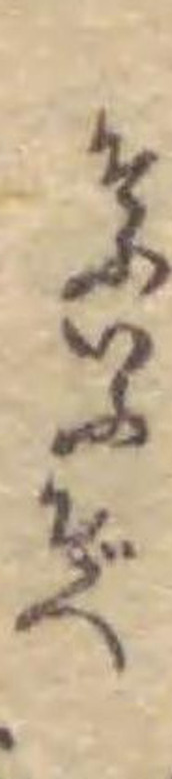そふいふぞへ
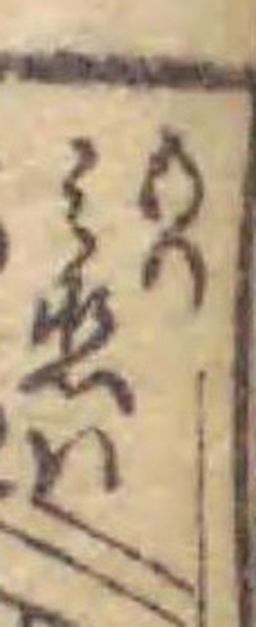の丞は
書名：扨化狐通人 : 2巻
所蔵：国立国会図書館 National Diet Library, JAPAN
